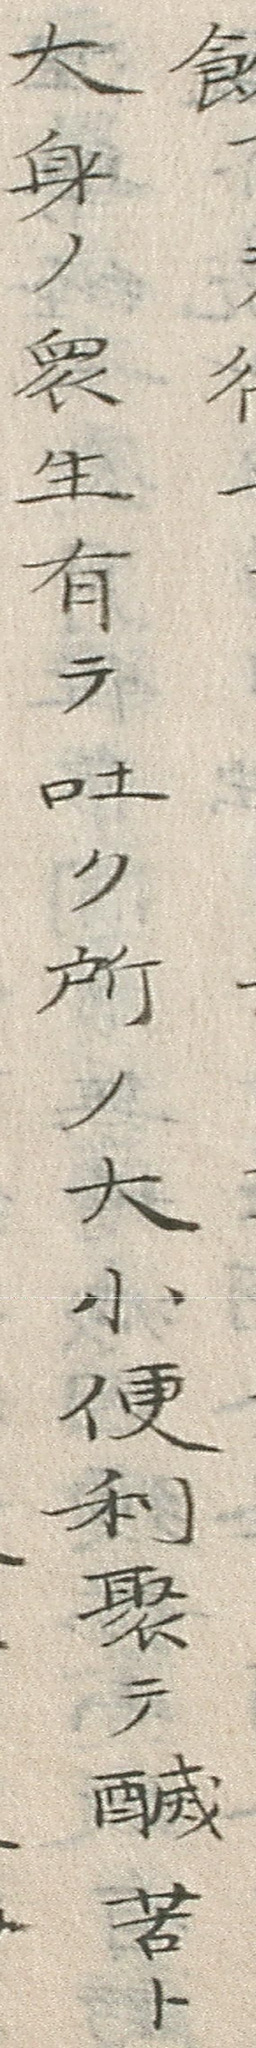大身ノ衆生有テ吐ク所ノ大小便利聚テ醎苦ト
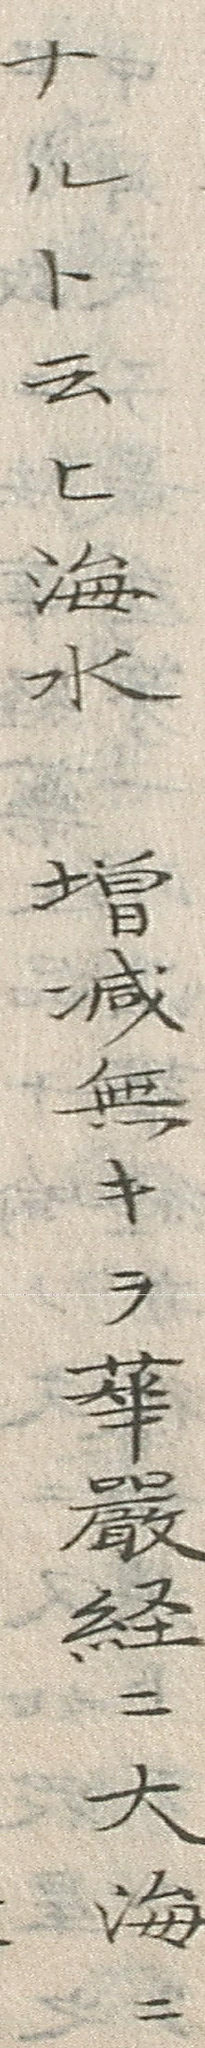ナルト云ヒ海水増減無キヲ華厳経ニ大海ニ
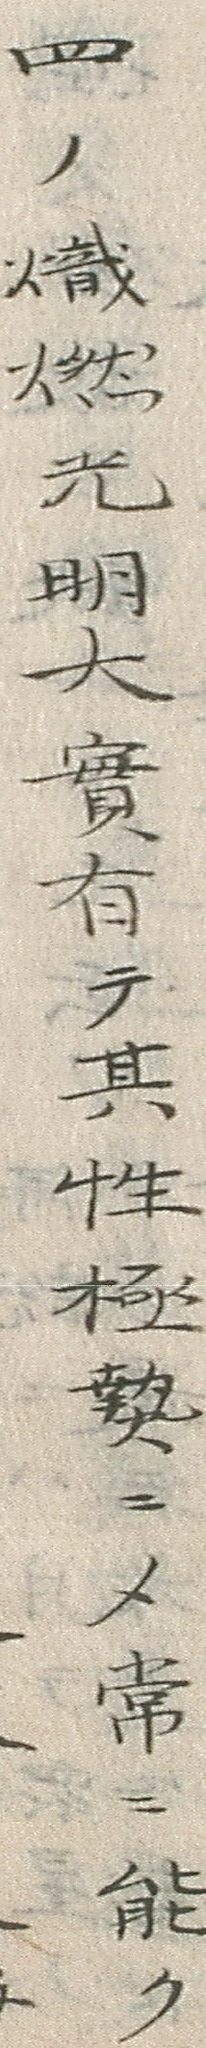四ノ熾燃光明大実有テ其性極熱ニシテ常ニ能ク
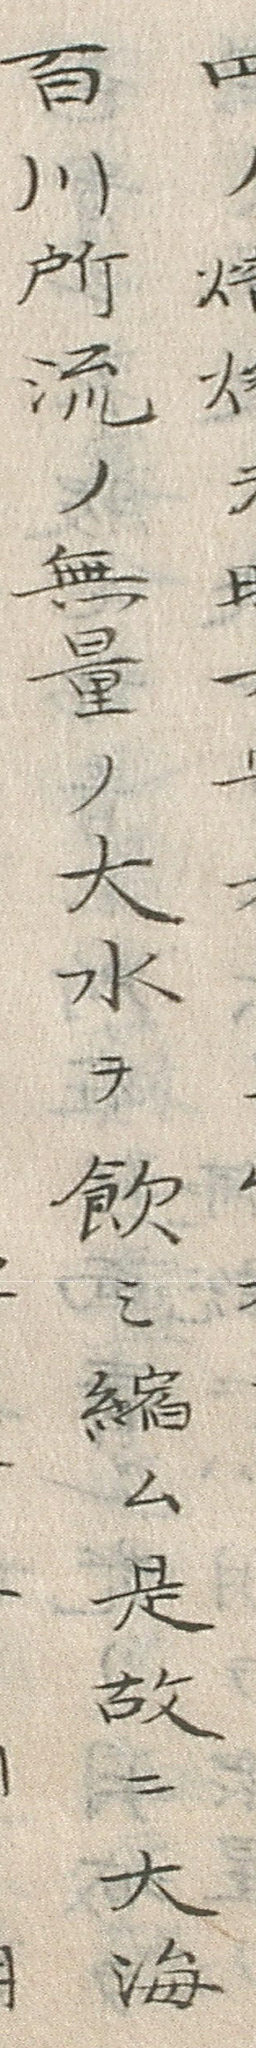百川所流ノ無量ノ大水ヲ飲ミ縮ム是故ニ大海
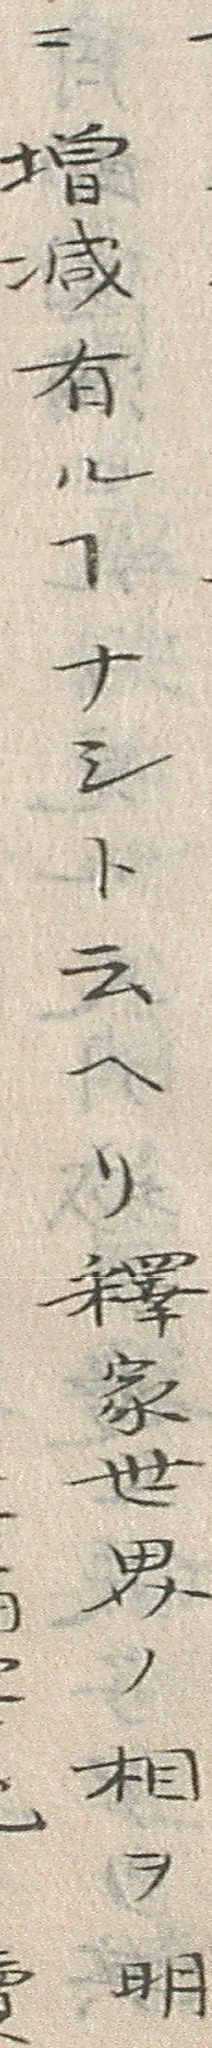ニ増減有ルコトナシト云ヘリ釈家世界ノ相ヲ明
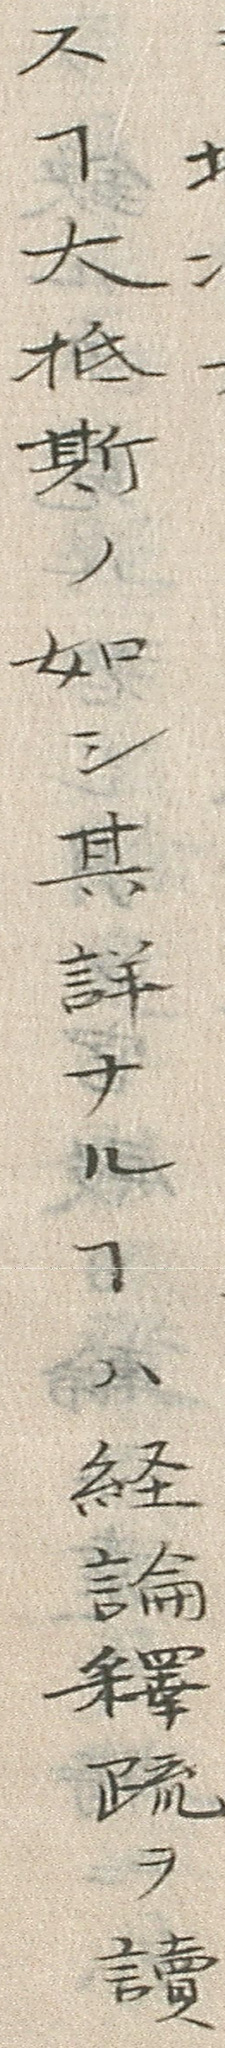スコト大抵斯ノ如シ其詳ナルコトハ経論釈疏ヲ読
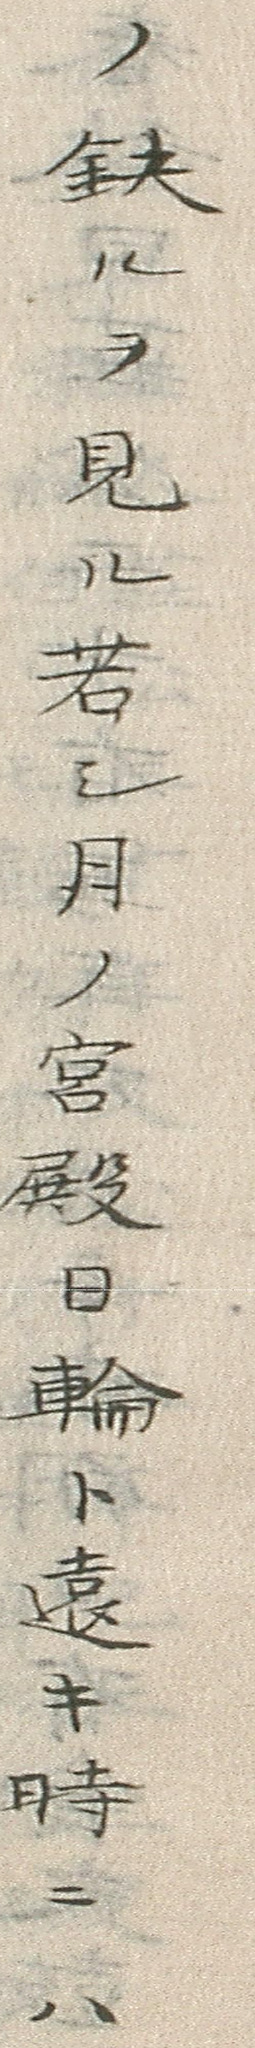ノ鈌ルヲ見ル若シ月ノ宮殿日輪ト遠キ時ニハ
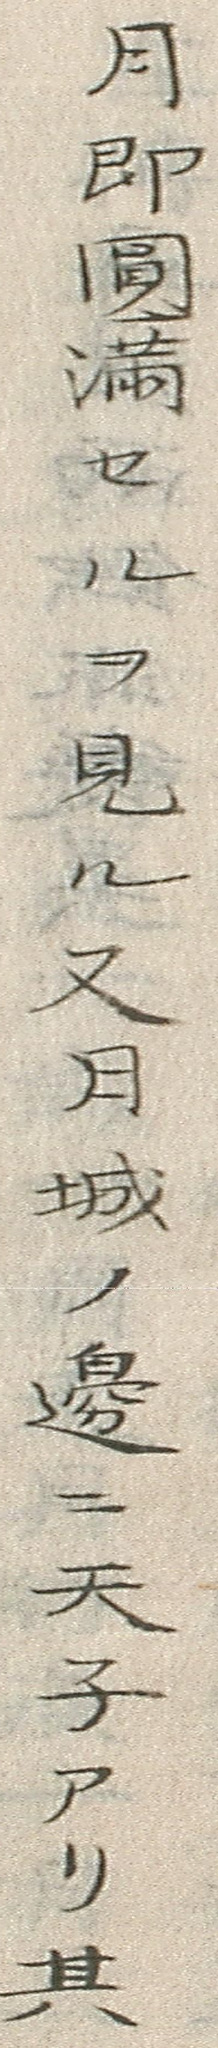月即円満セルヲ見ル又月城ノ辺ニ天子アリ其
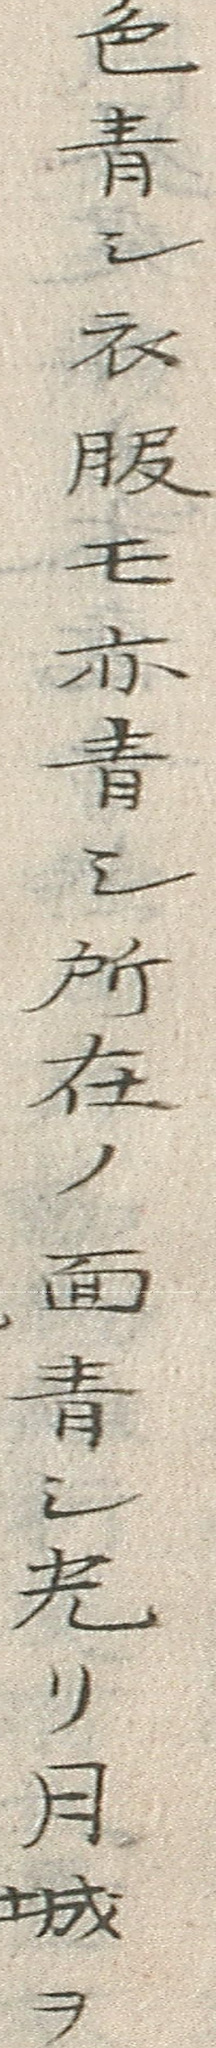色青シ衣服モ亦青シ所在ノ面青シ光リ月城ヲ
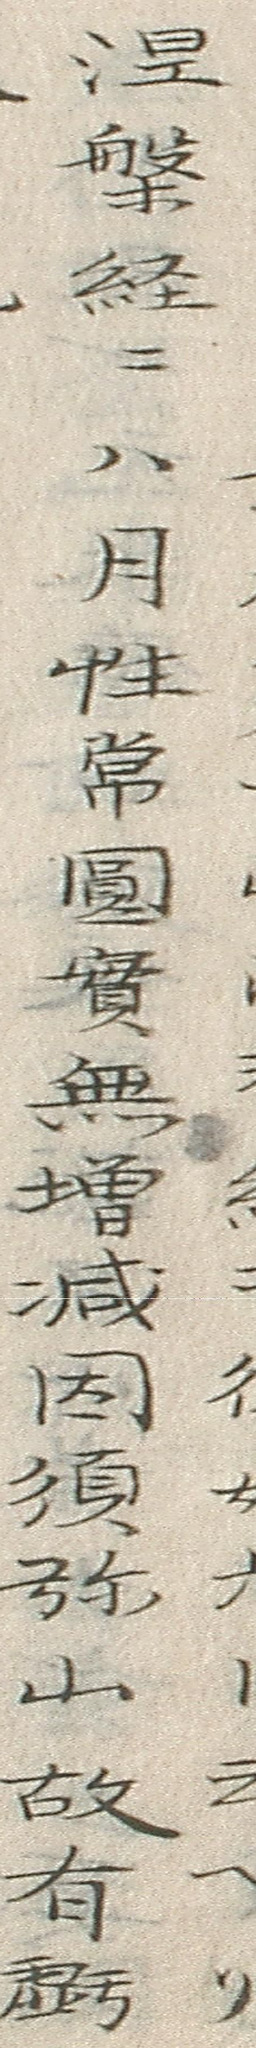涅槃経ニハ月性常円実無増減因須弥山故有虧
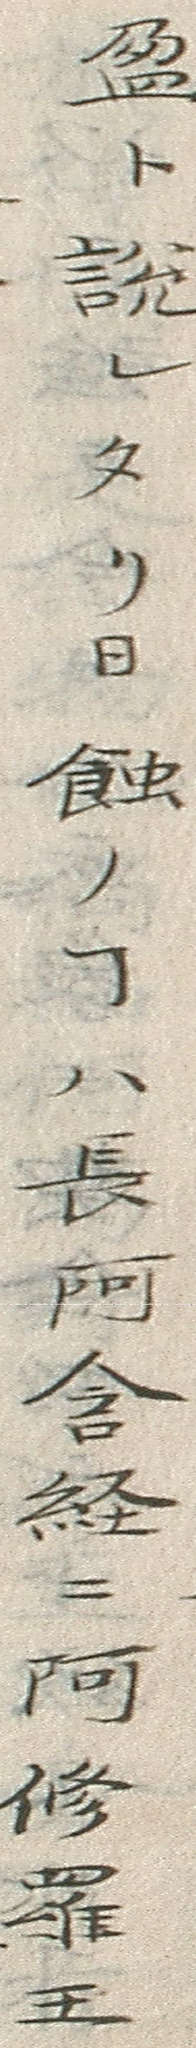盈ト説レタリ日蝕ノコトハ長阿含経ニ阿修羅王
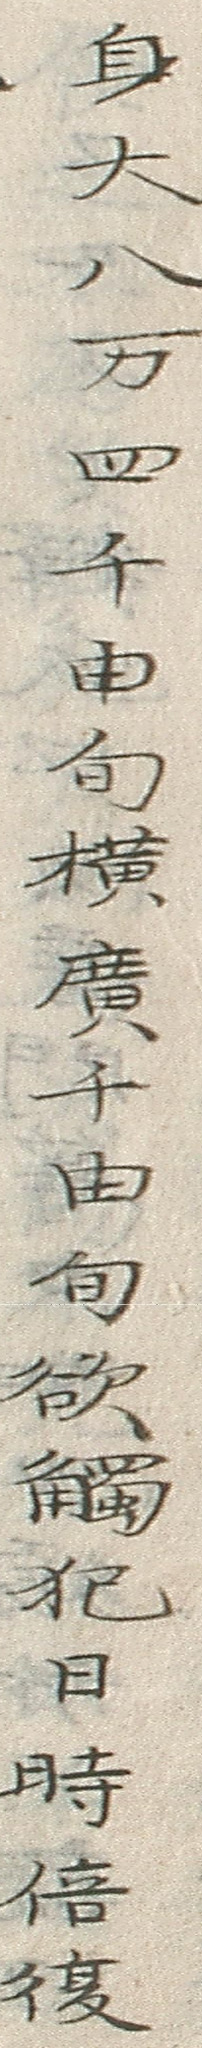身大八万四千由旬横広千由旬欲觸犯日時倍復
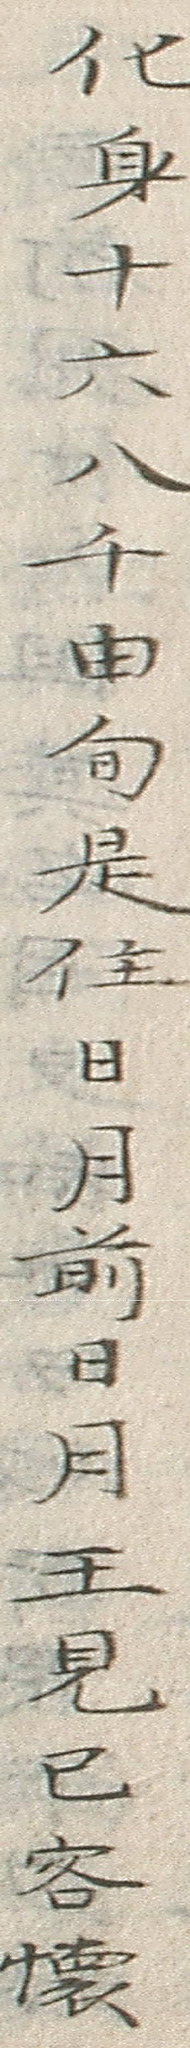化身十六八千由旬是住日月前日月王見已容懐
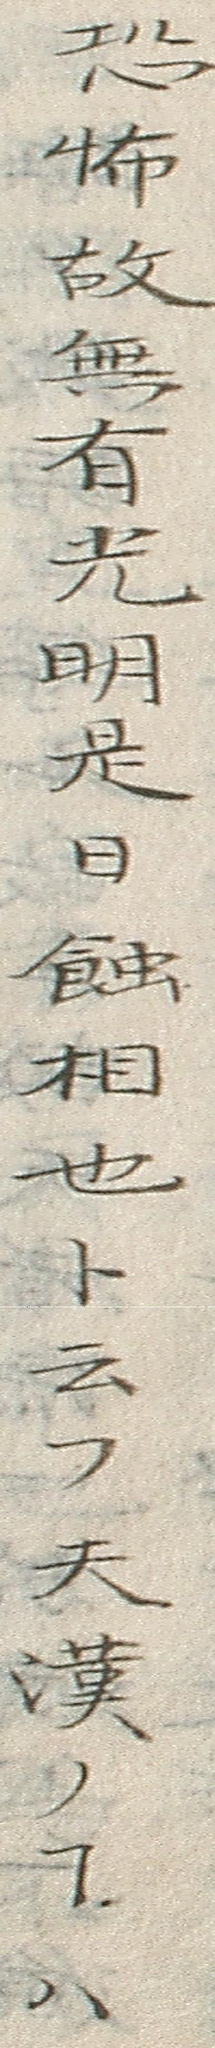恐怖故無有光明是日蝕相也ト云フ天漢ノコトハ

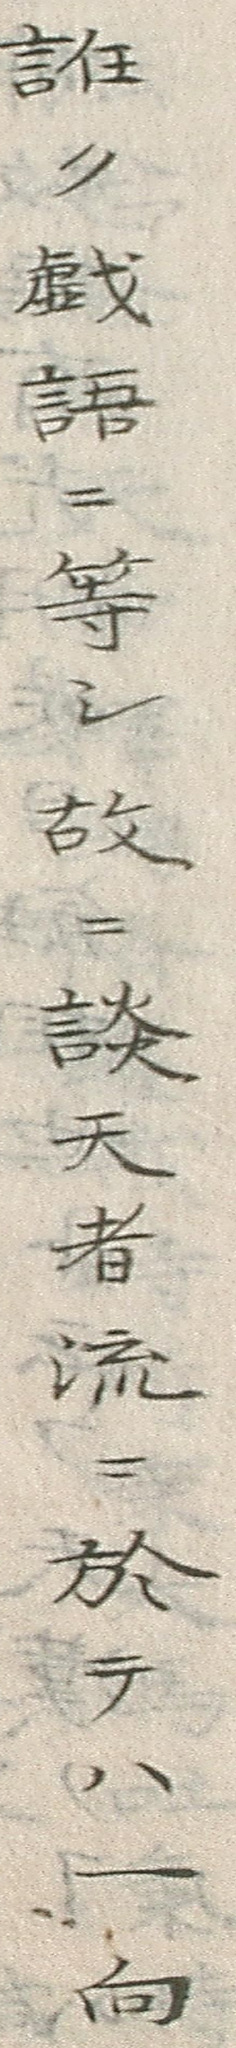誑〃戯語ニ等シ故ニ談天者流ニ於テハ一向
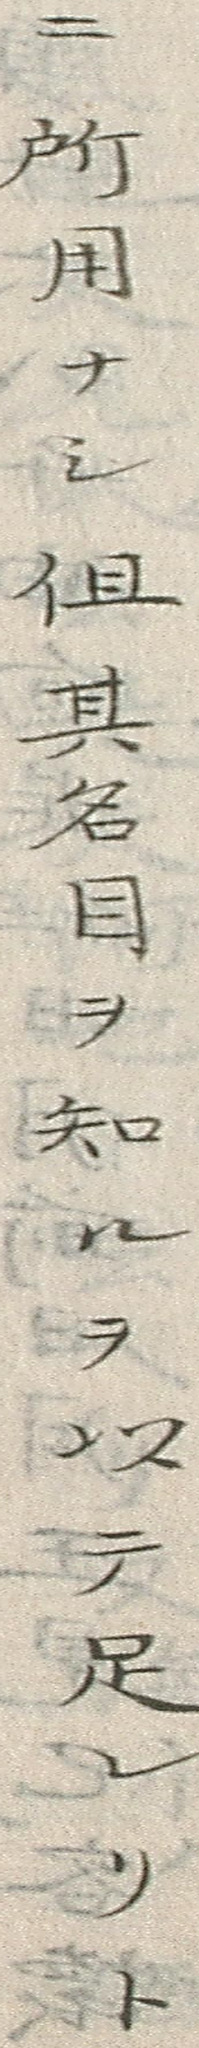ニ所用ナシ但其名目ヲ知ルヲ以テ足レリト
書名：天學略名目羽翼　全
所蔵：東京大学地震研究所図書室 Earthquake Research Institute Library, The University of Tokyo, JAPAN
